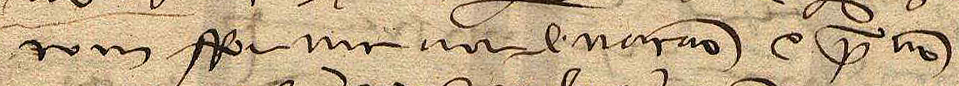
comfforme a ordenação e p̄o nō
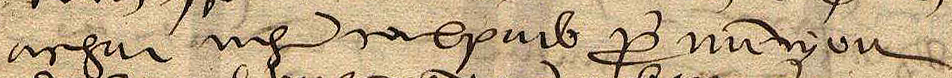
achar nehū colpado ꝓnūcyou
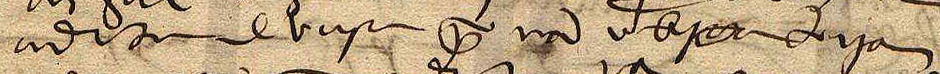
a dita devasa p̄o nā obrjgatorja
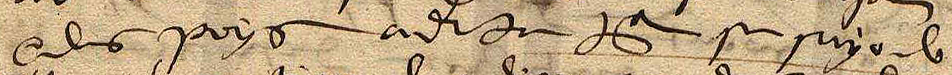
e despoys a dita ta se sayo do
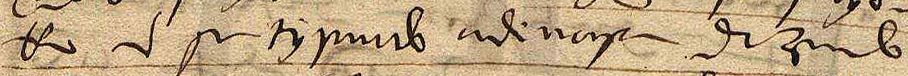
Ro ē se tyrando a deuasa dizendo
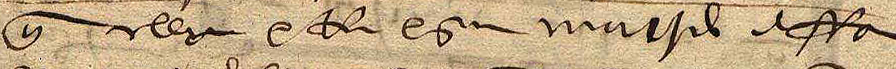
q̄ ella e Re e seu marjdo deffa
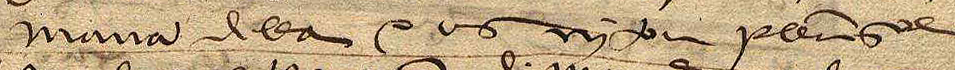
mauā della e os citou pllā sol
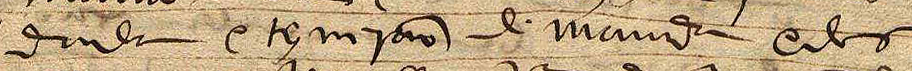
dada e tyuerão demanda e des
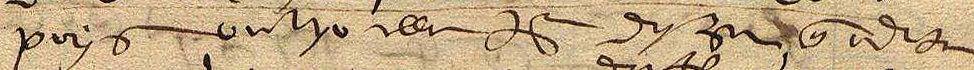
poys ouvyo ella ta dyzer q̄ a dita
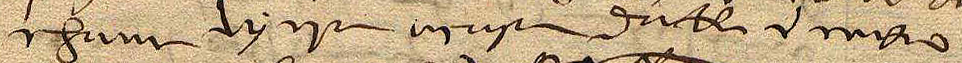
chaue vyera a casa da Re ē centeo
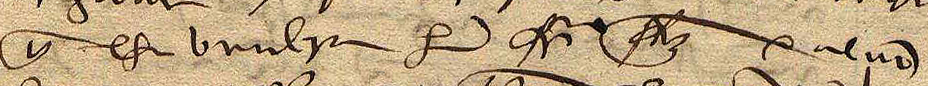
q̄ lhe vendera hū frco ffrz̄ e al nō
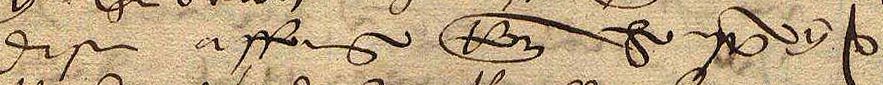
dise affonso R̄oz ho esp̄vy
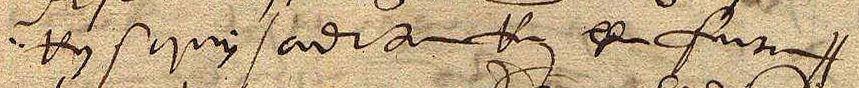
Risquey / a dita Re lhe furta //
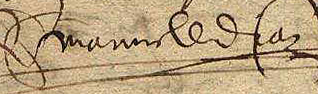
manuell diaz
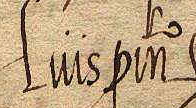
Luis pinro
